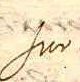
Jur
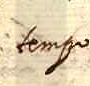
tempo
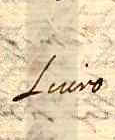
Liuro
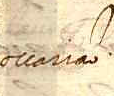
occasiaõ
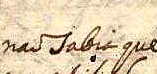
naõ sabia, que
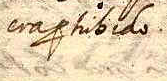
era ꝓhibido.
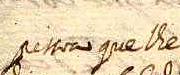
pessoa que lhe
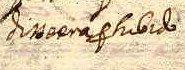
disse era ꝓhibido
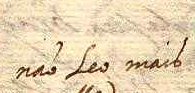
naõ Leo mais
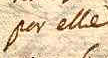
por elle
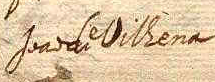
Joaõ de Vilhena
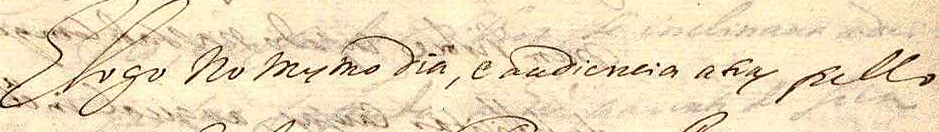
E logo no mesmo dia, e audiencia atras pello
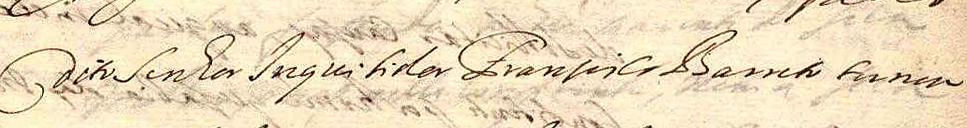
dito Senhor Inquisidor Francisco Barreto tornou
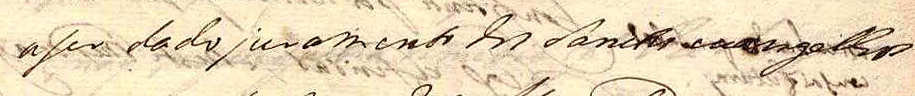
a ser dado juramento dos Sanctos euangelhos
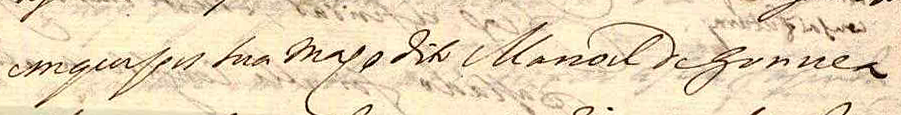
em que pos sua maõ o dito Manoel de Gouuea
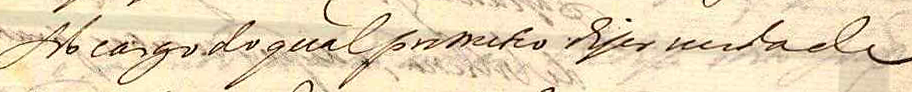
sob cargo do qual prometeo diser uerdade
